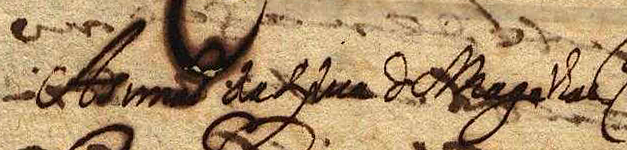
A simaõ da sylua de Magalhaẽs
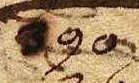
390
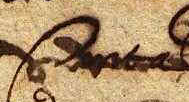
Conta
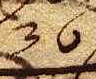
36
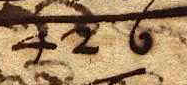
426
